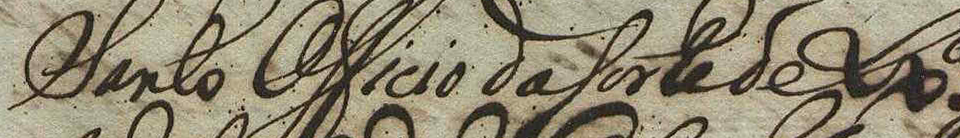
Santo Officio da Corte de Lx.a
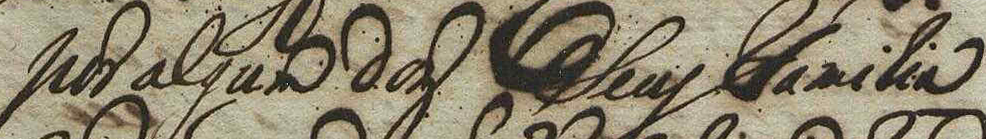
por algum doz Seus Familia
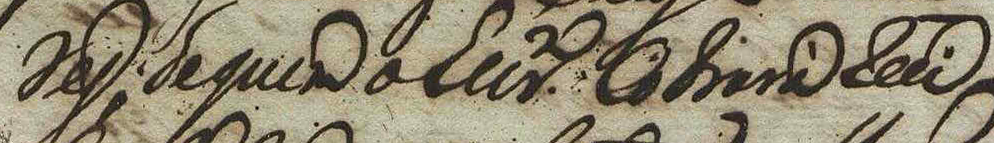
res; de quem o Escr.m Os trarà Reci
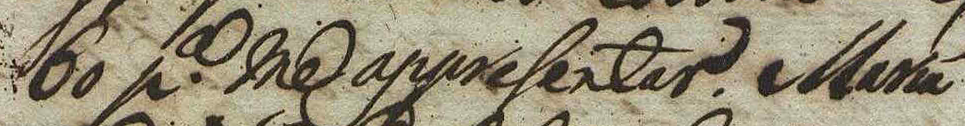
bo p.a me appresentar. Maria
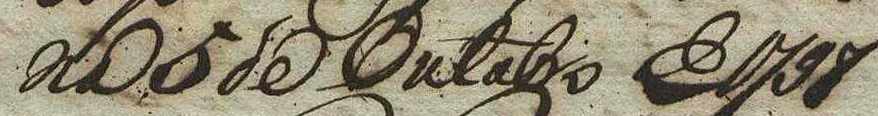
na 5 de Outubro E 1797
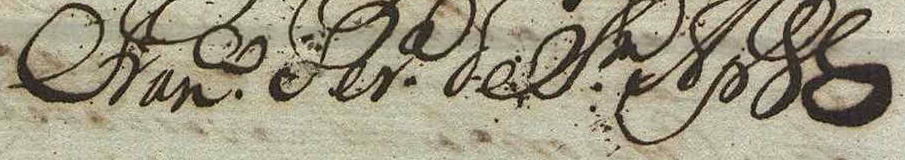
Fran.co Fer.a de S.m Ap
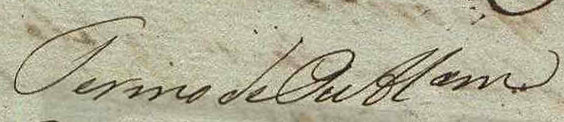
Termo de Publ.am
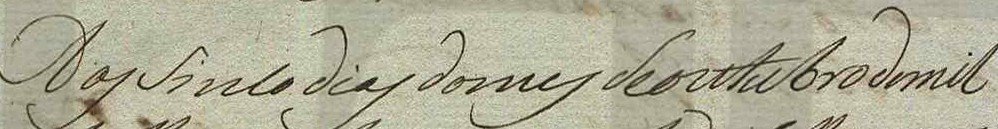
Aos sinco dias do mes de outubro de mil
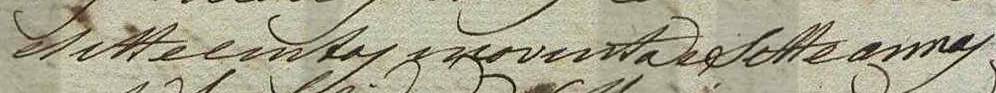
e settecentos e noventa e Sette annos
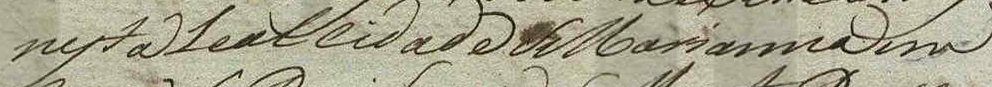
nesta Leal cidade de Marianna em
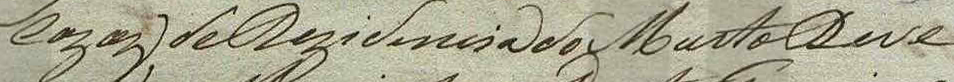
Cazaz de Rezidencia do Muito Reve
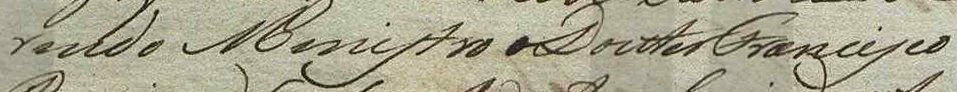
rendo Menistro o Doutor Francisco
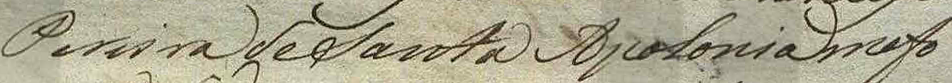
Pereira de Santa Apolonia me fo
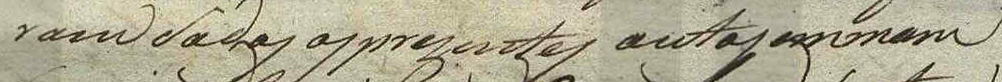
ram dados os prezentes autos em mam
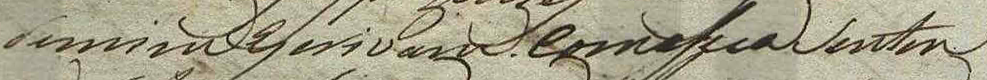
de mim escrivam com a sua senten
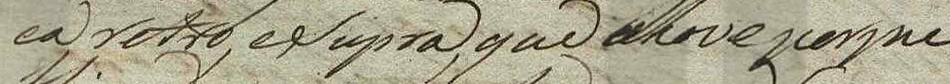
ca retro, e Supra, que a hove por pu
